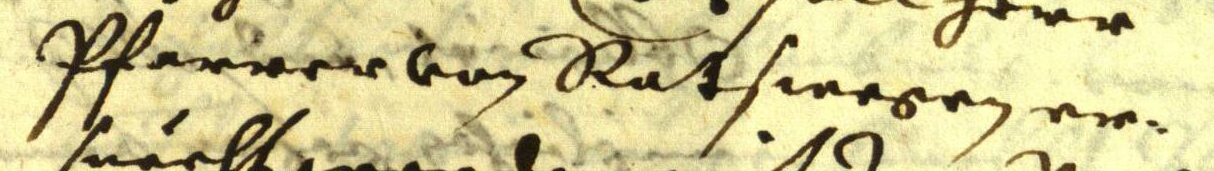Pfarrer von Rats wegen er¬
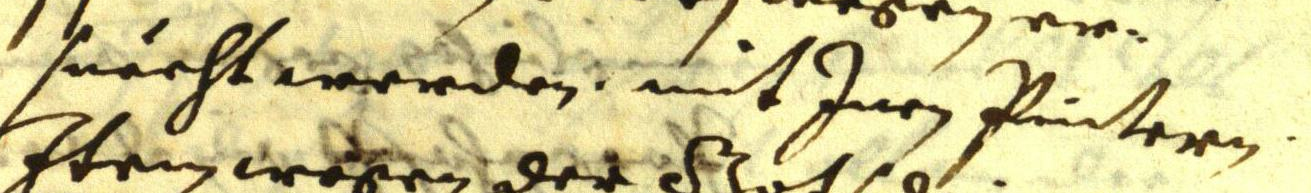sūecht werden. mit Inen Pintern
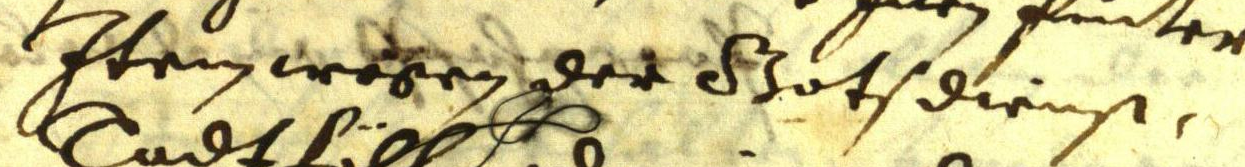Item wegen des Gotsdienst,
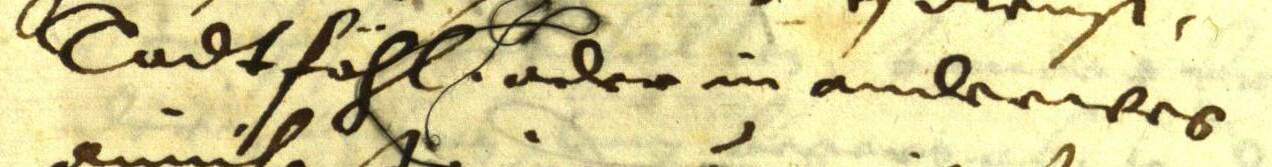Todtföhl. oder in anderweg
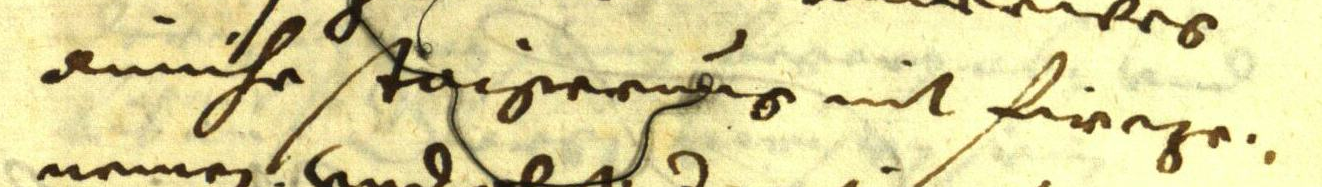ainiche staigerūng nit firze¬
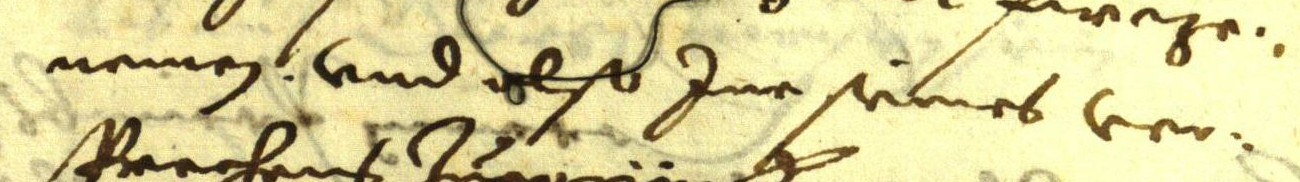nemen. vnd also Ine seines ver¬
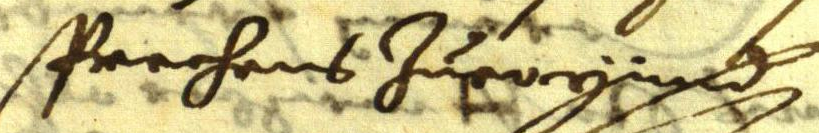sprechens Zūerÿnnd.
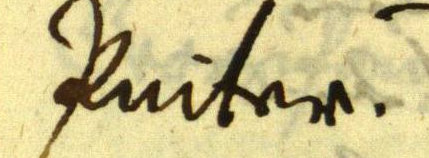Pinter.
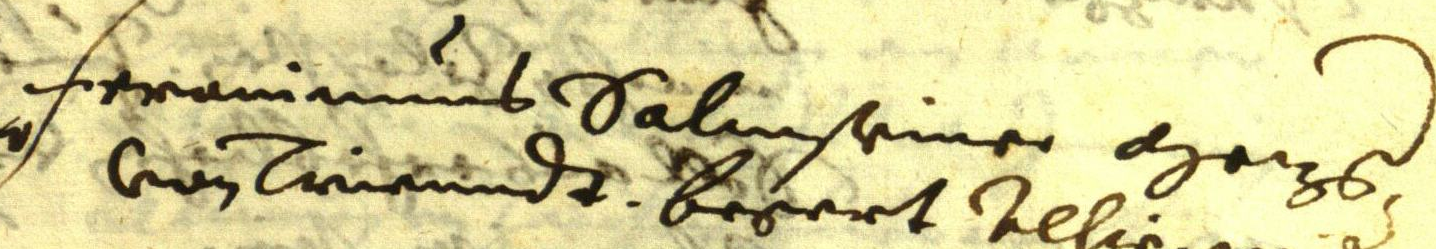Jeronimūs Salmsteiner Mezg,
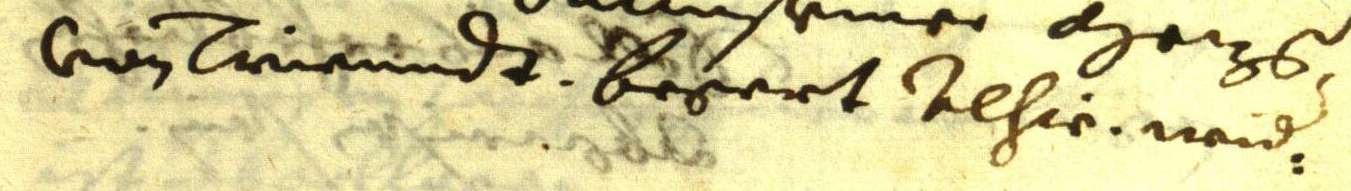von Trienndt. begert Alhie. wid¬
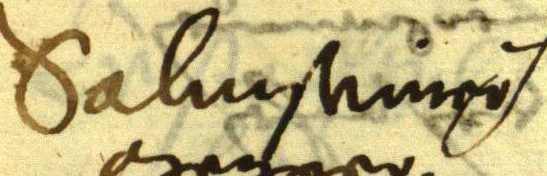Salmsteiner
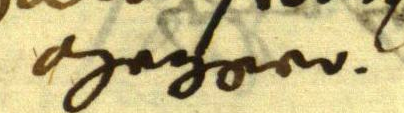Mezger.
